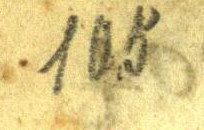105
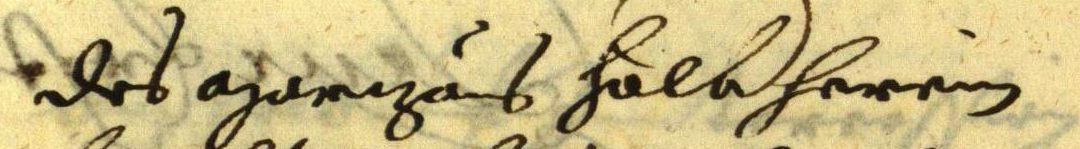des Marzāns halb herein
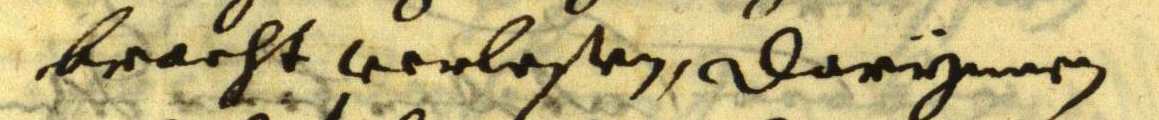bracht verlesen, darÿnnen
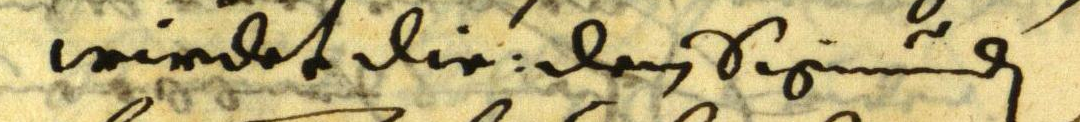wirdet die: dem Sigmūnd
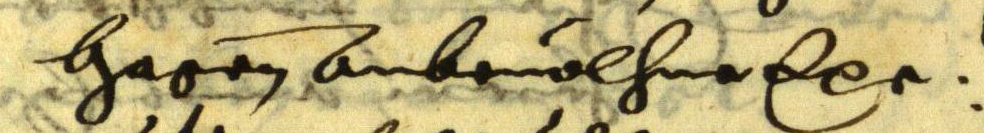Hagen Anbeūolhne Exe¬
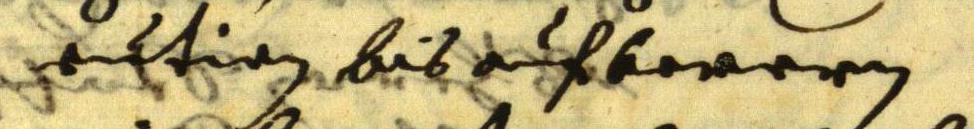cūtion bis aūf verern
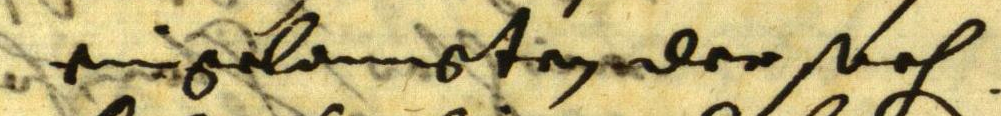eingelanngten der sach
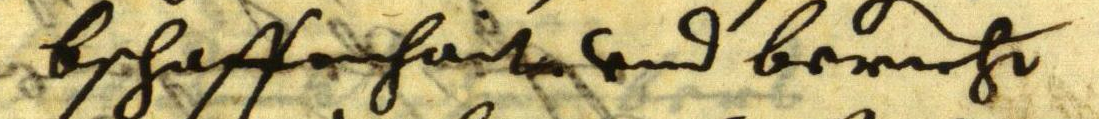bschaffenhait vnd bericht
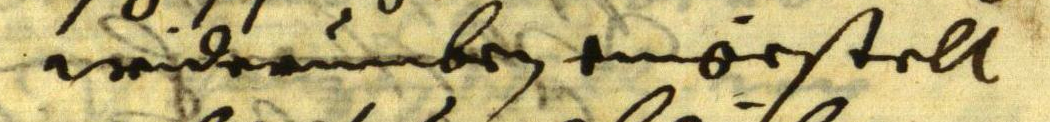widerūmben eingestelt
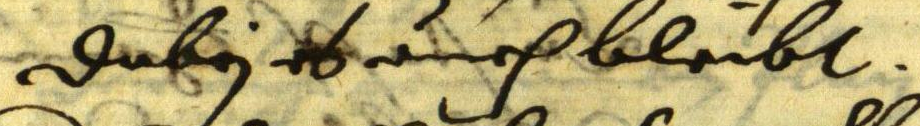dabej es aūch bleibt.
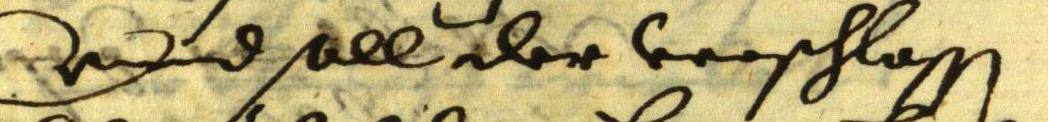Vnnd soll der verschloss
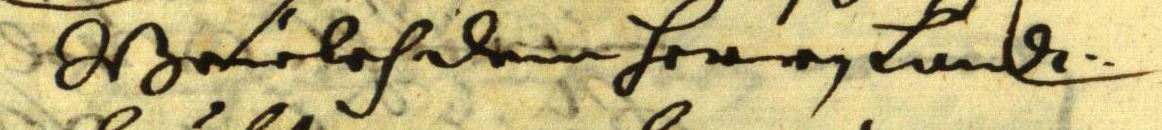Beūelch dem herrn Landt¬
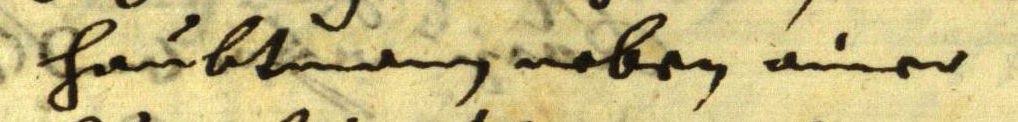haūbtmann neben ainer
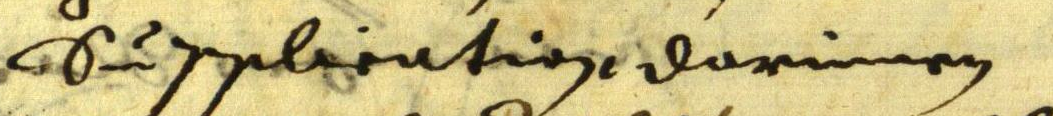Sūpplication darinnen
